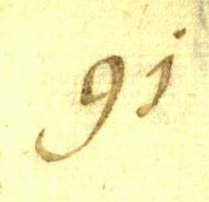91
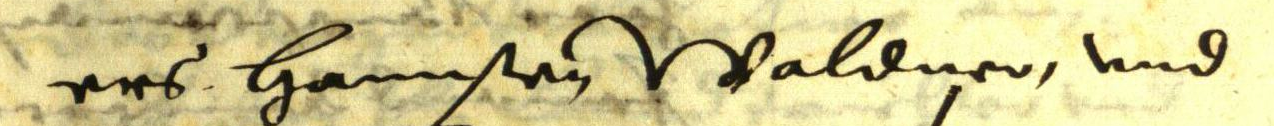ers. Hannsen Waldner, vnd
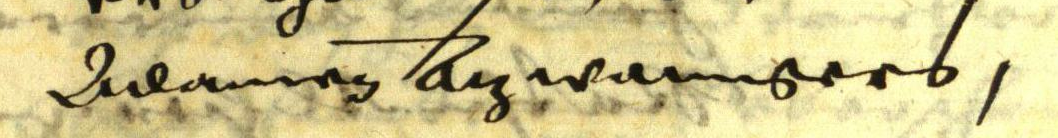Adamen Azwanngers,
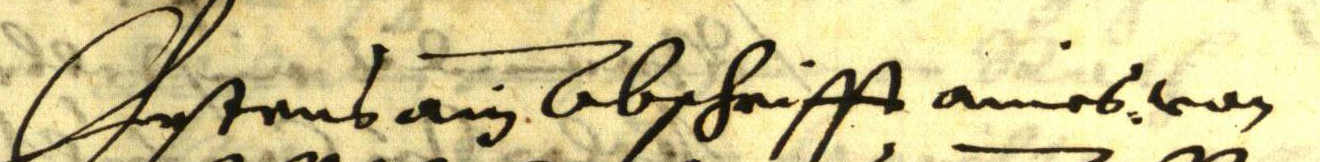Erstens ain Abschrifft aines. von
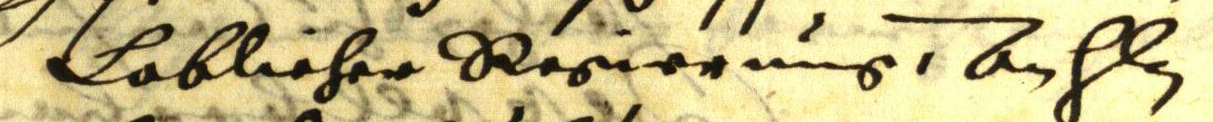Loblicher Regierūng, An hln
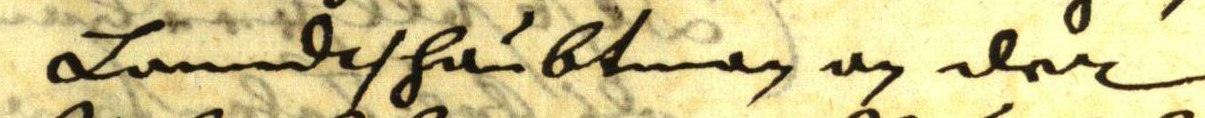Lanndtshaūbtman an der
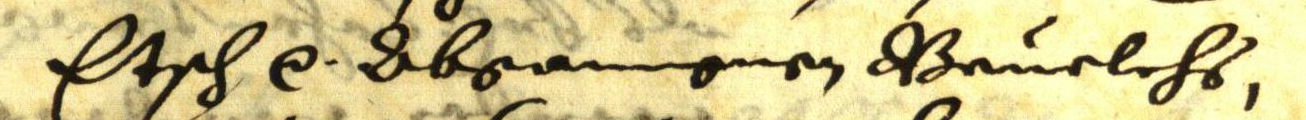Etsch etc. Abganngnen Beūelchs,
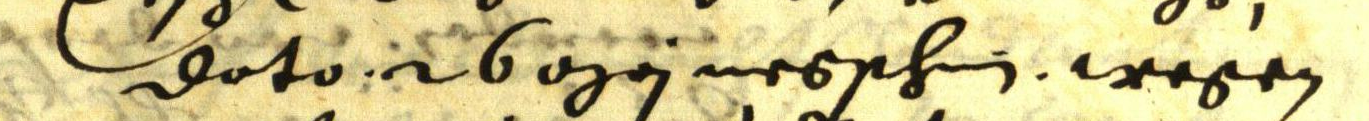dato .26 Maj negsthin. wegen
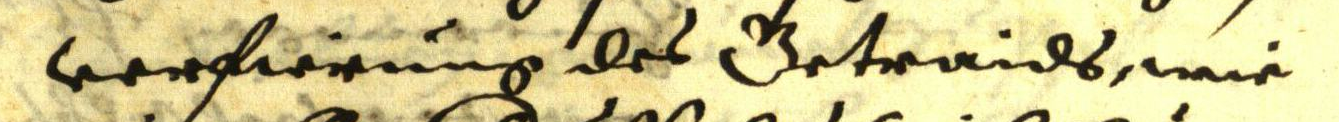verfierūng des Getraids, wie
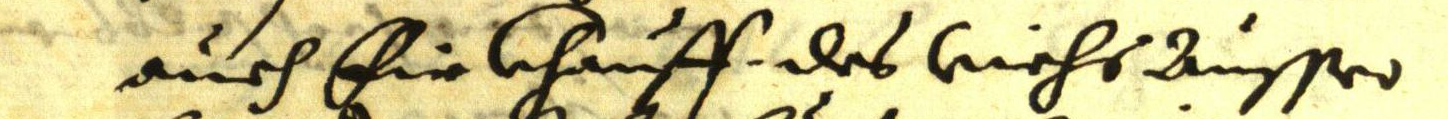aūch Firkhaūff. des viehs Aūsser
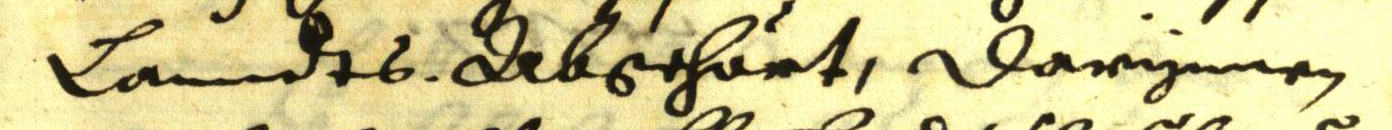Lanndts. Abgehōrt, darÿnnen
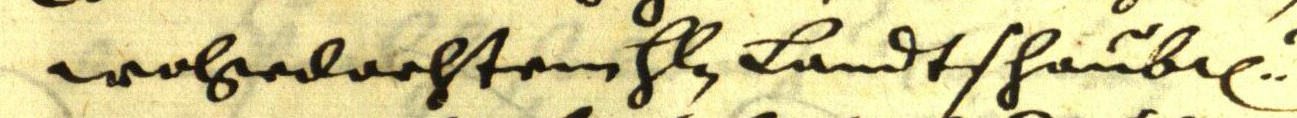wolgedachtem hln Landtshaūbt:
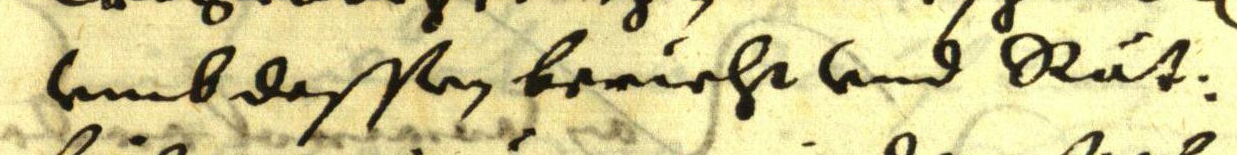umb dessen bericht vnd Rāt¬
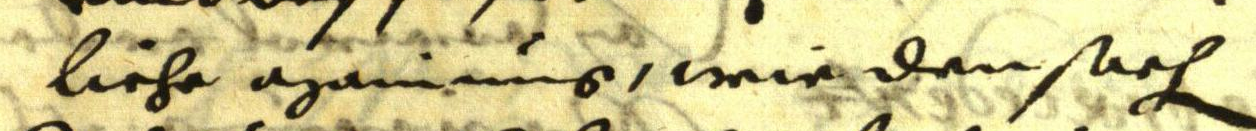liche Mainūng, wie den sach
